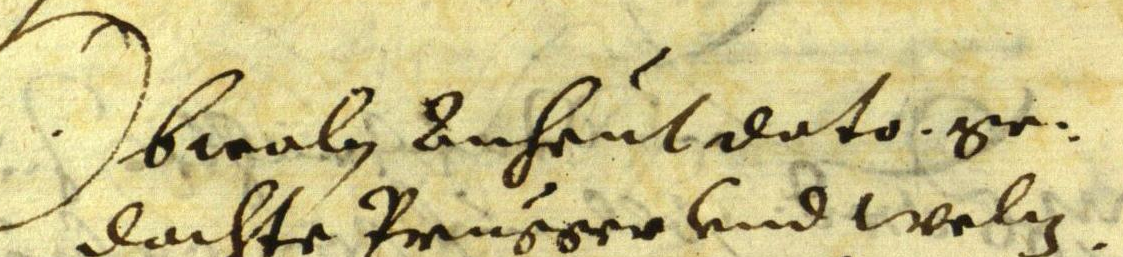Obwoln Anheūt dato. ge¬
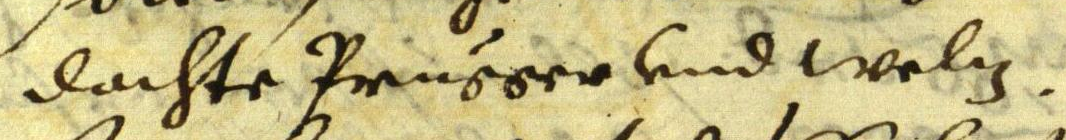dachte Prūgger vnd Welz.
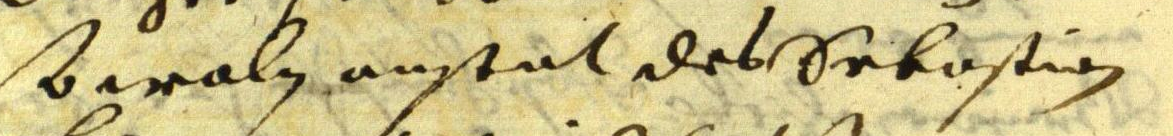so woln anstat des Sebastian
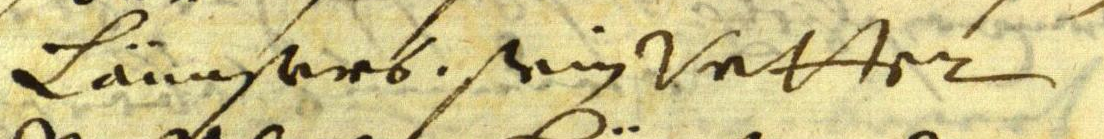Lännsers. sein Vetter
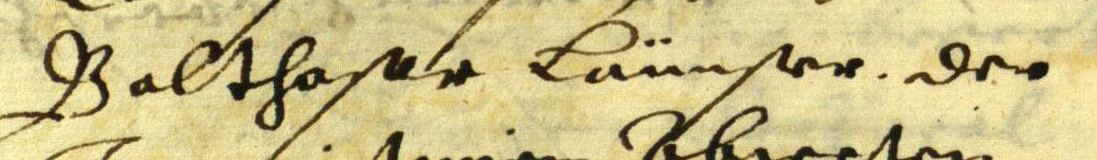Balthasar Lännser. der
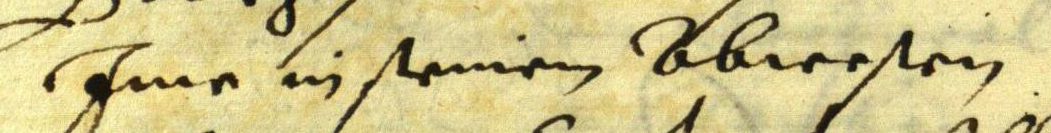Ime in seinem Abwesen
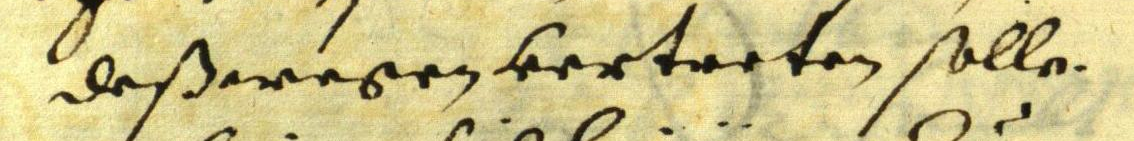deßwegen vertreten solle.
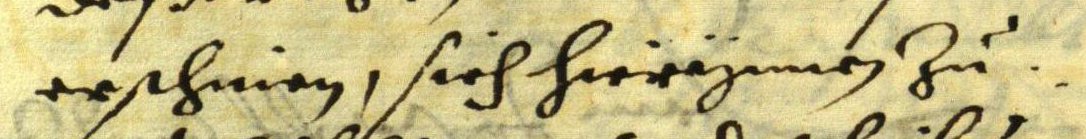erschinen, sich hierÿnnen Zū¬
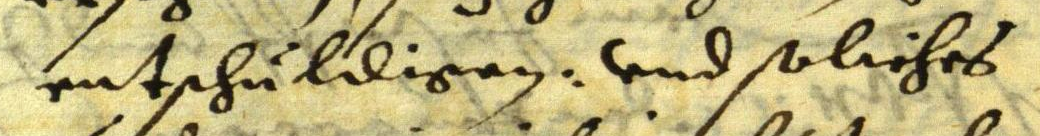entschūldigen: vnd soliches
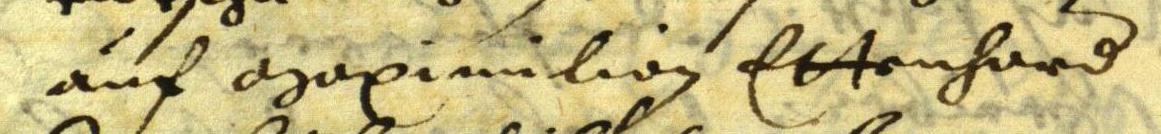aūf Maximilian Ettenhard
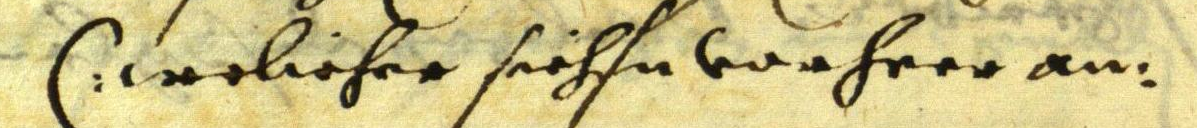(: welicher sich In vorhero an¬
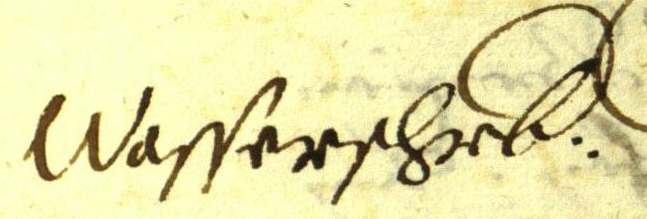Wasserschreib.
